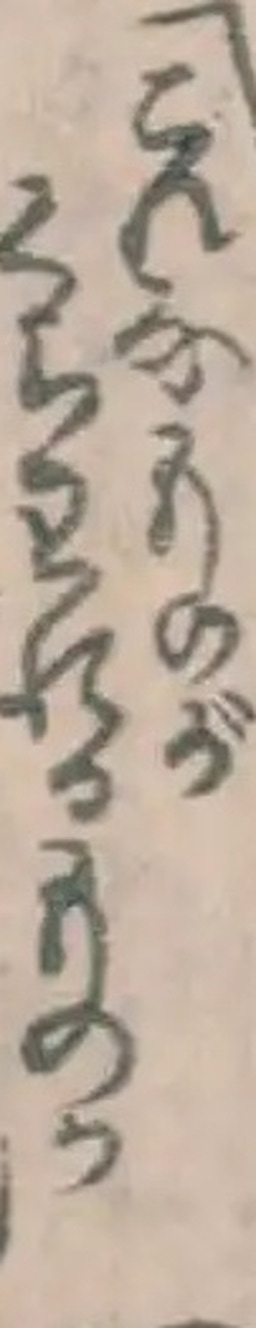くらわれるものか
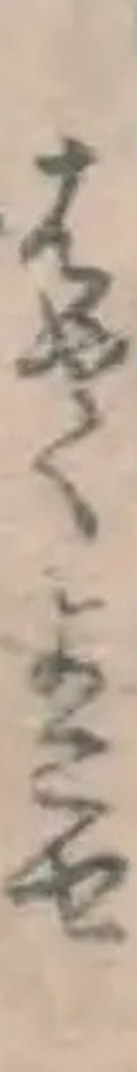はやくよこせ
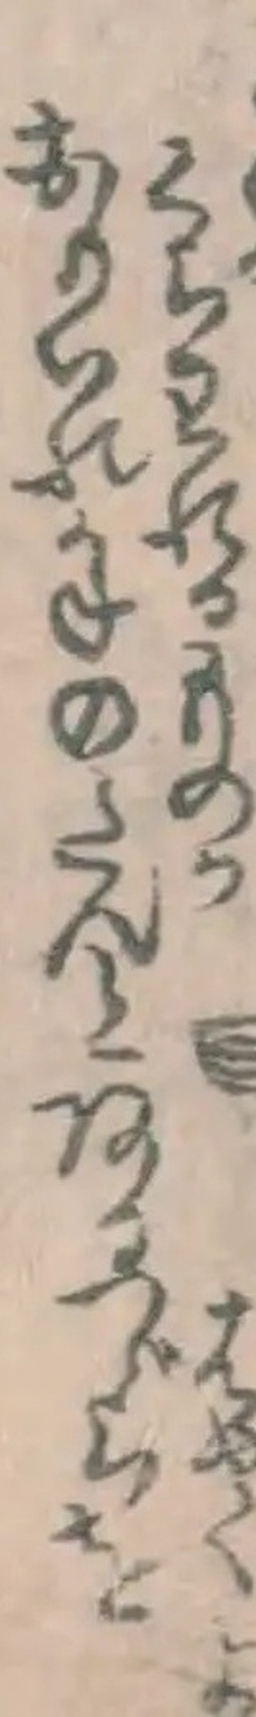おもいのかねのたんとあるつゞらを

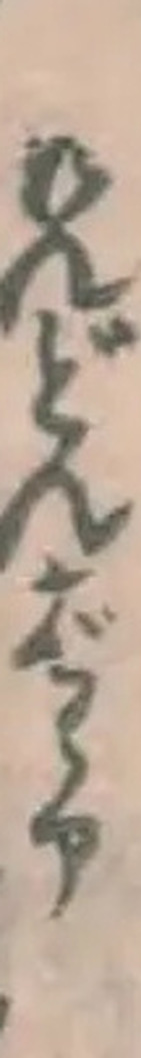けんどんばゝあ
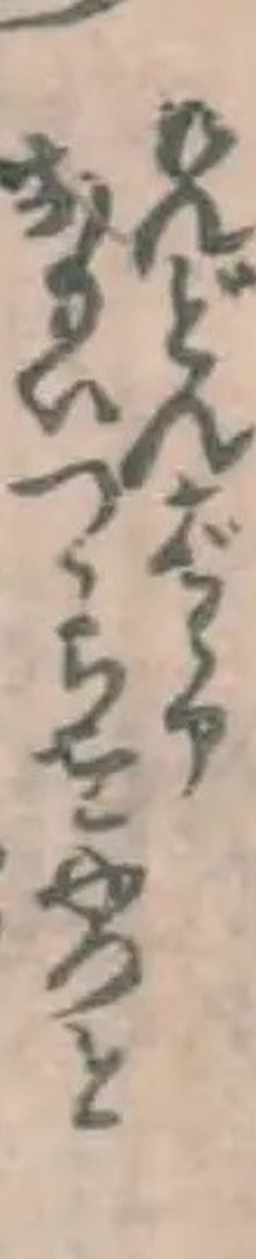おもいつゝらをやつと
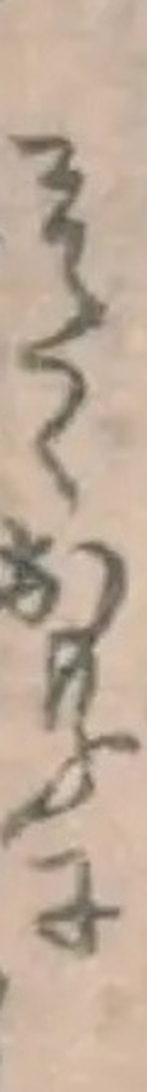みたくおもふに
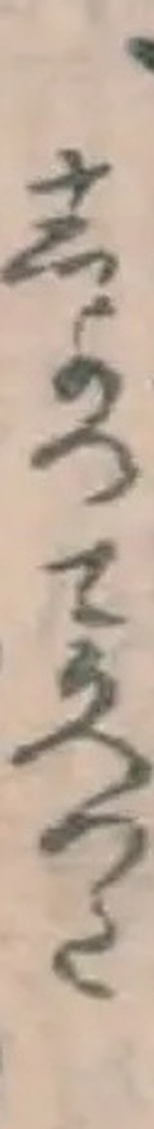しよつてかへつた
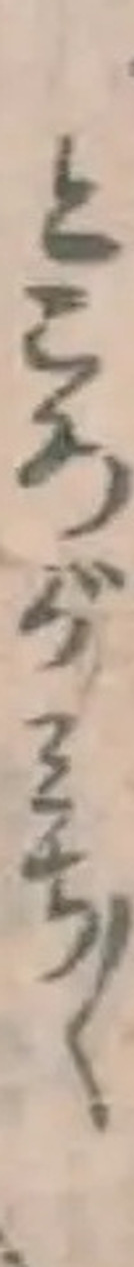ところがみち〳〵
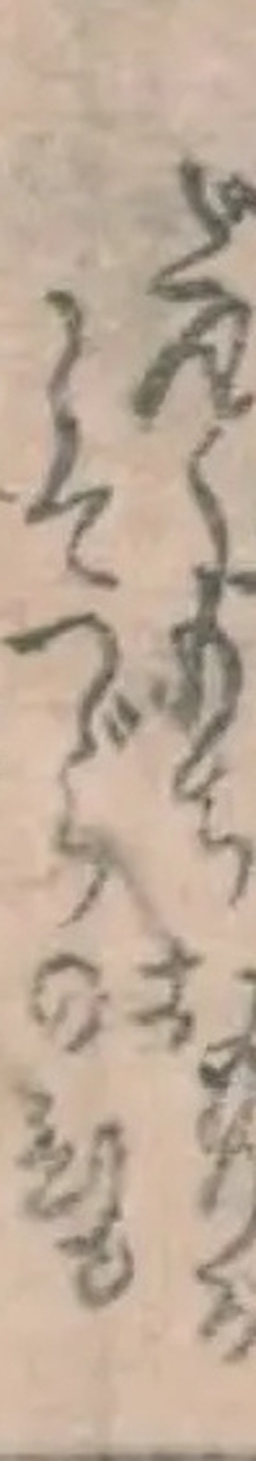してつゞらのひも
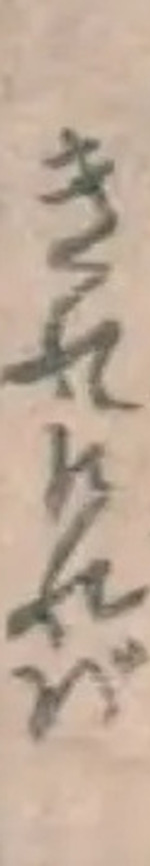きれければ
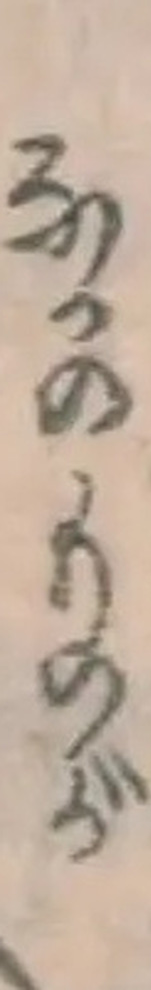なかのものが
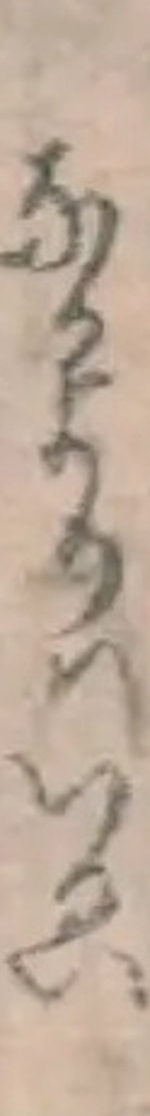なかよりはいるい
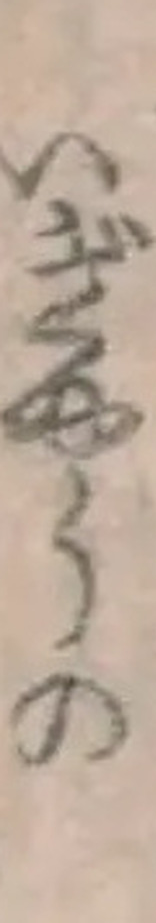いぎやうの
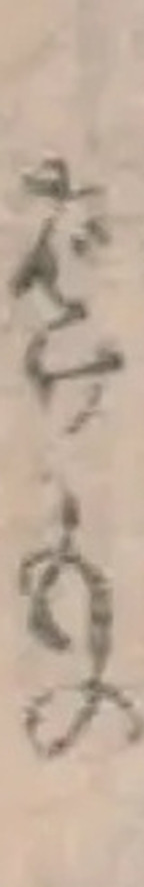ばけもの
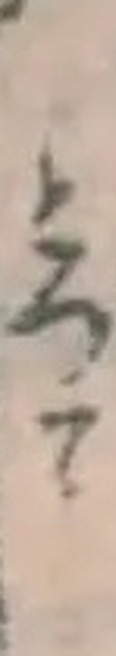とつて
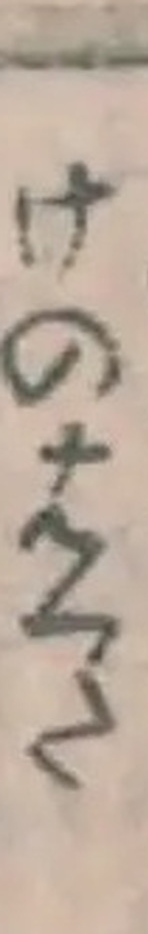けのはへた
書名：舌切雀
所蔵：国立国会図書館 National Diet Library, JAPAN
